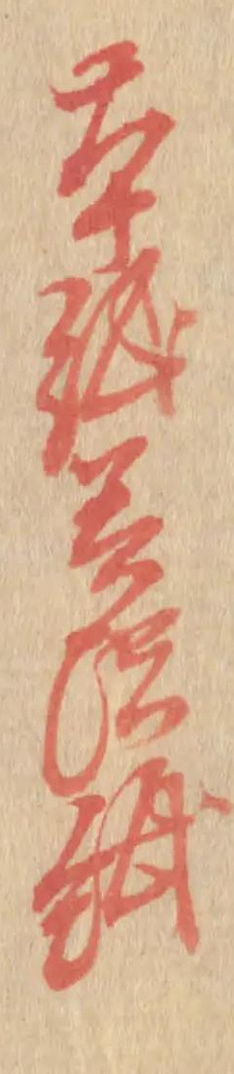本紙美濃紙
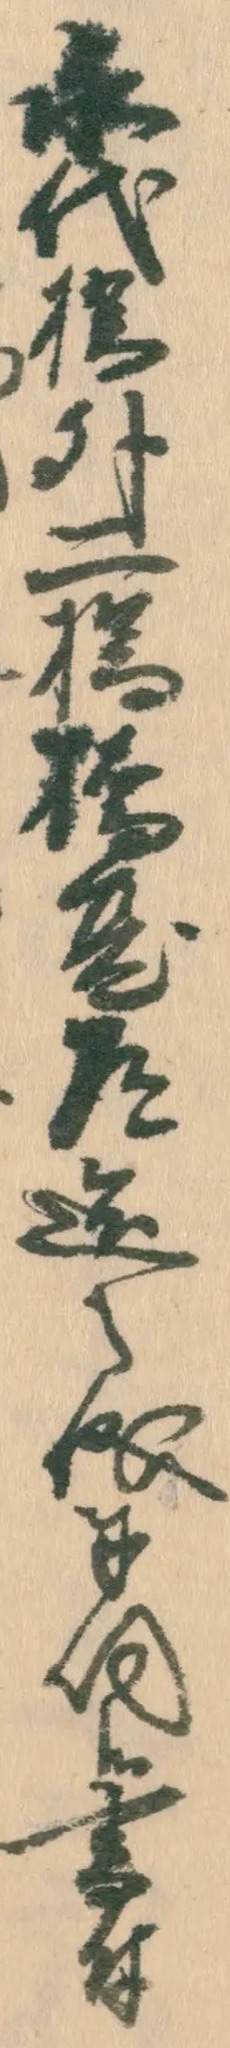永代橋外二橋橋台道造之儀奉伺候書付
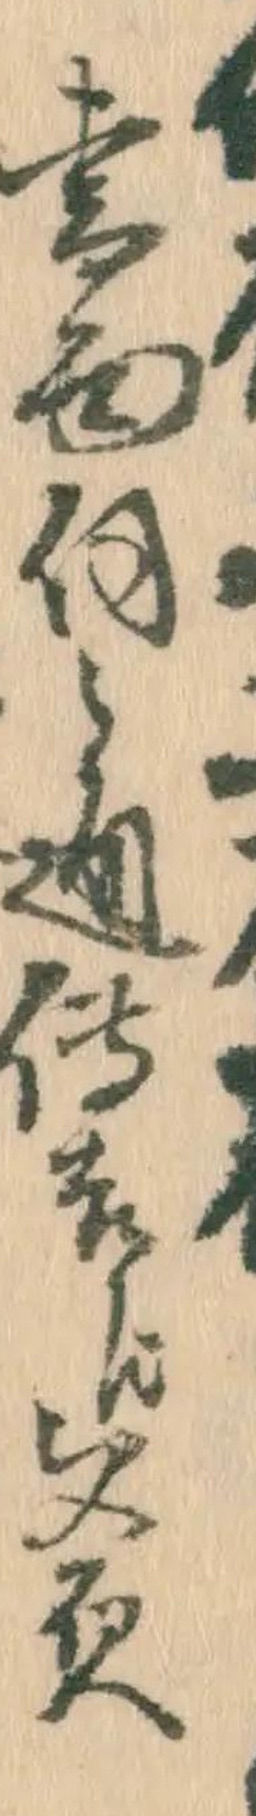書面伺之通伝吉え受負
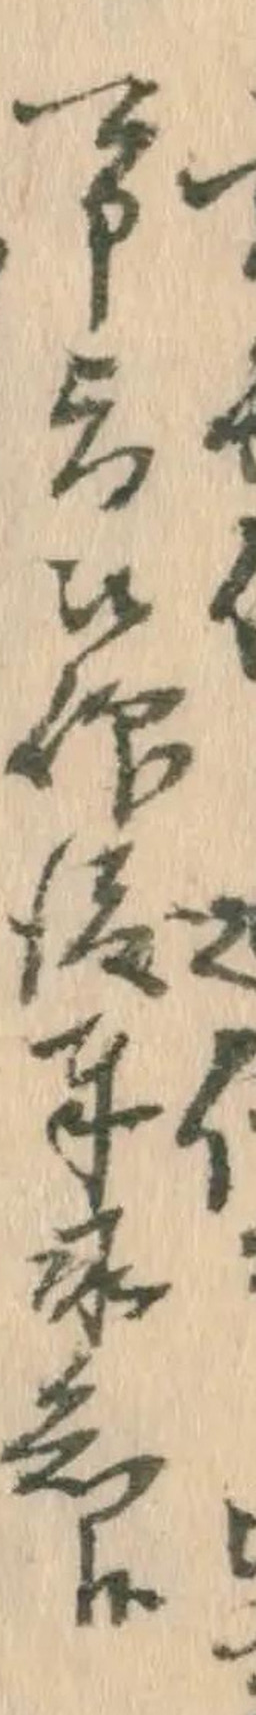可申旨被仰渡奉承知候
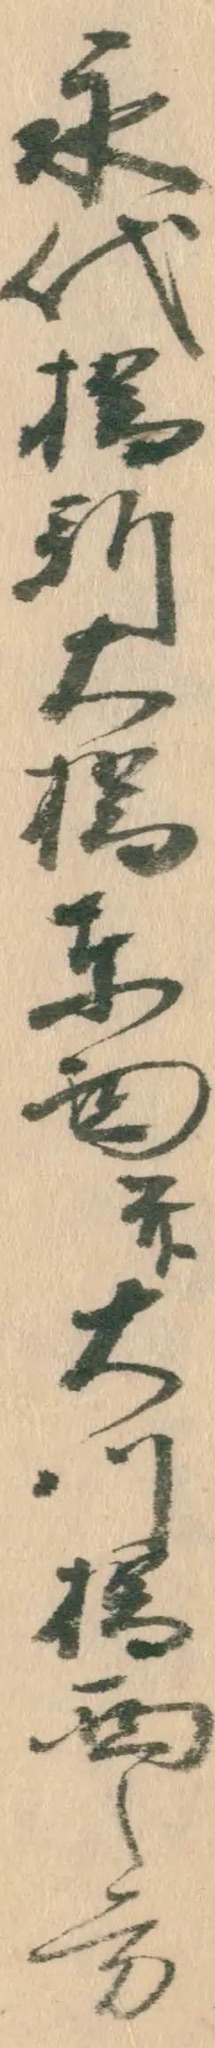永代橋新大橋東西并大川橋西之方
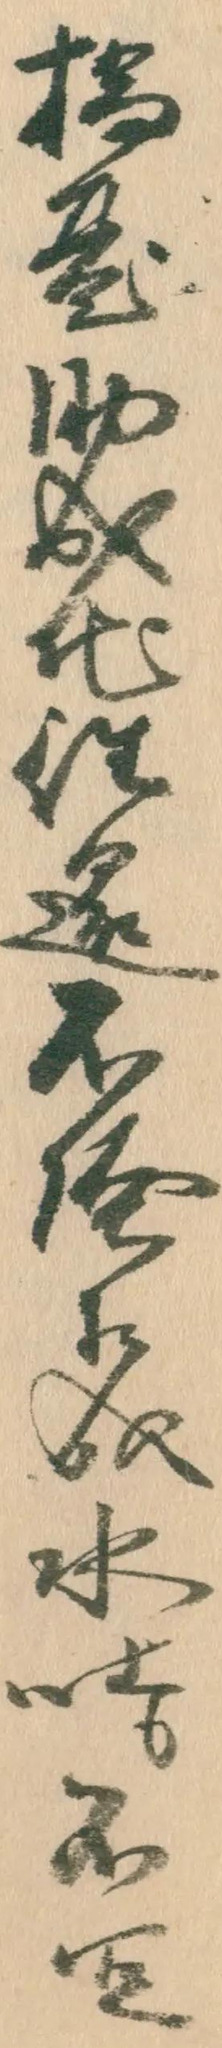橋台助成地往還不便相成水吐も不宜
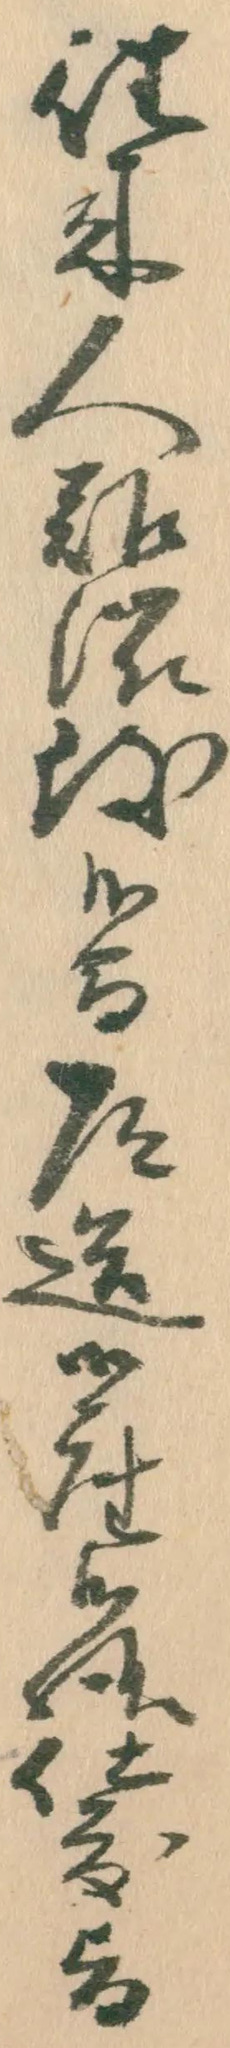往来人難渋致候間道造御座候様仕度旨

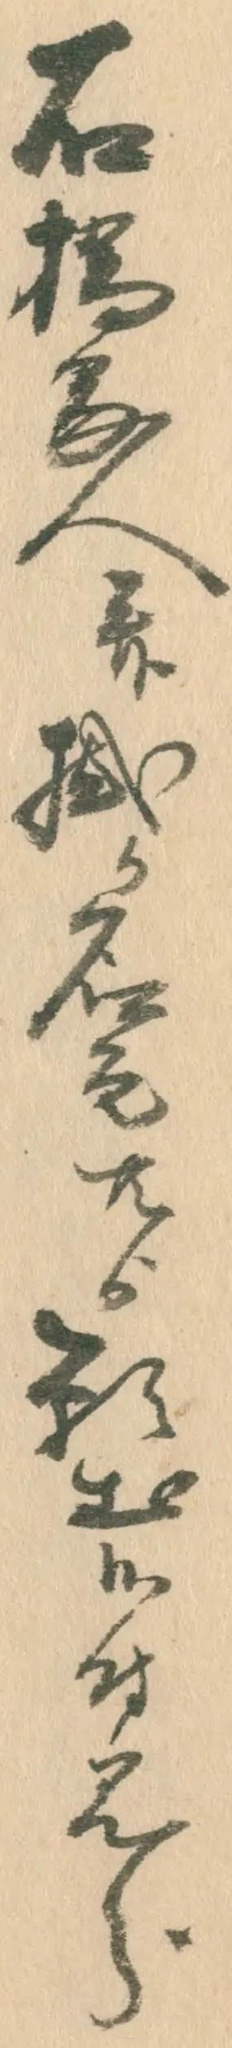右橋番人并掛り名主共ゟ願出候付見分
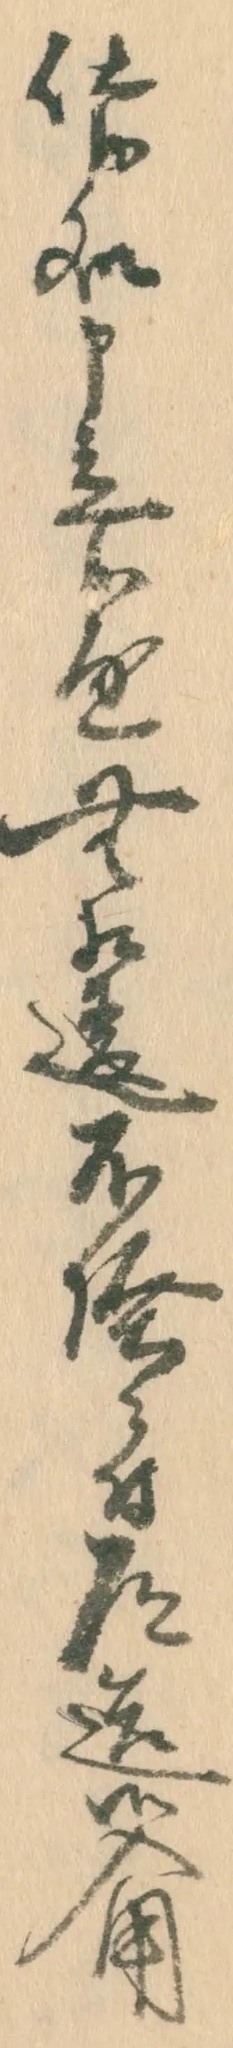仕候処申立候通無相違不陸ニ付道造御入用
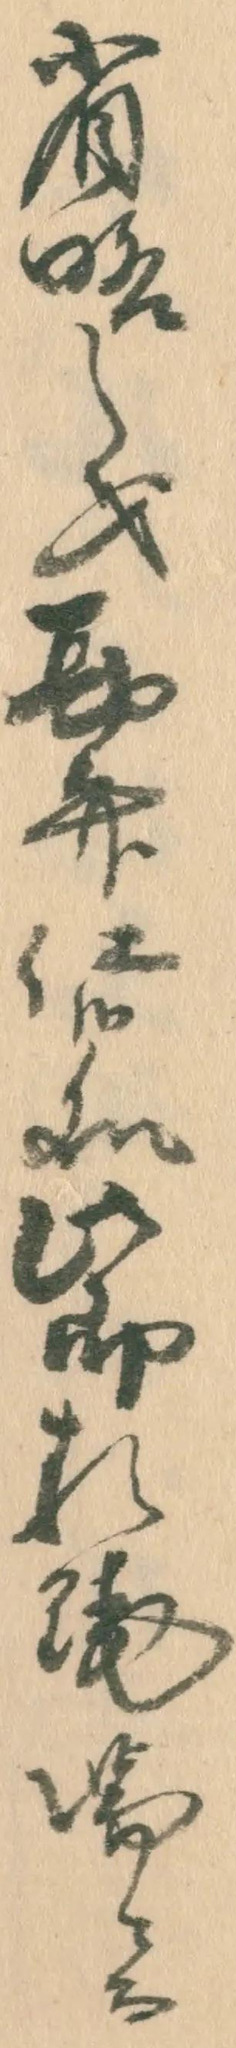省略之義勘弁仕候処此節類焼場ニ而
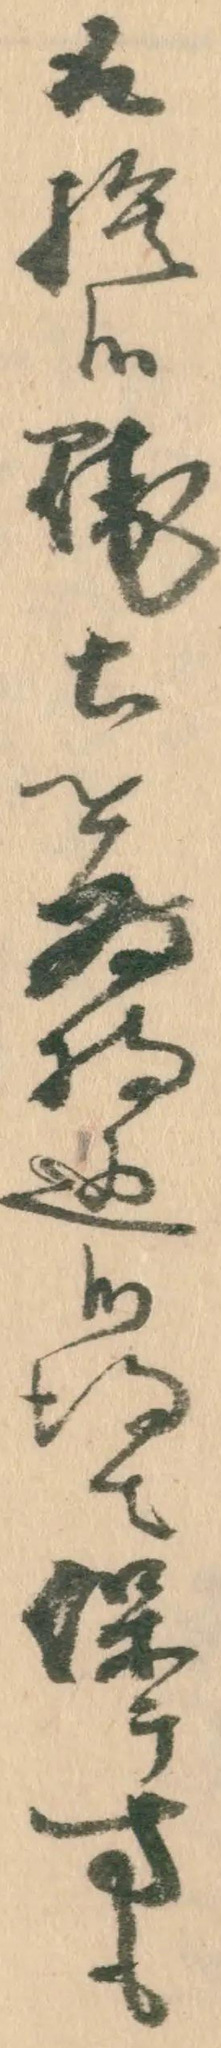取捨候焼土を為持込候得は保テ方も
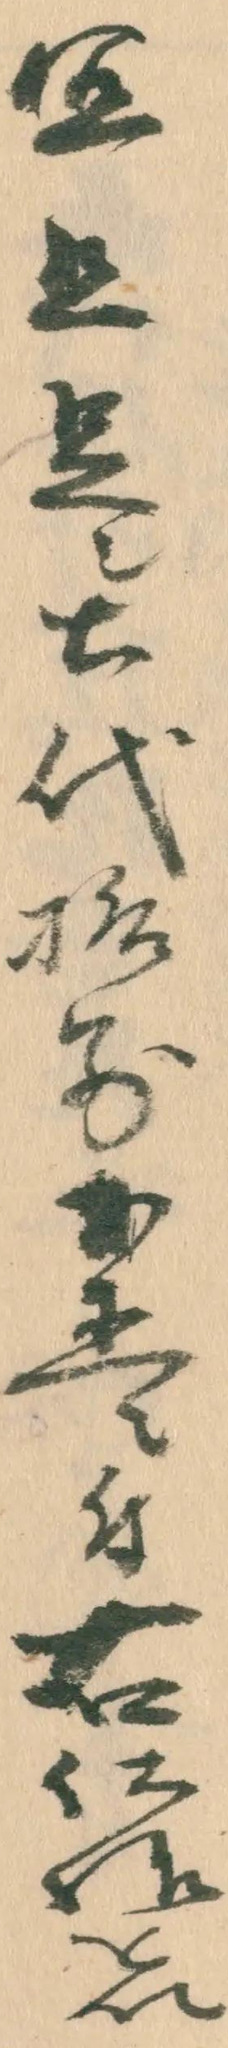宜且足シ土代格別下直ニ付右仕様を以
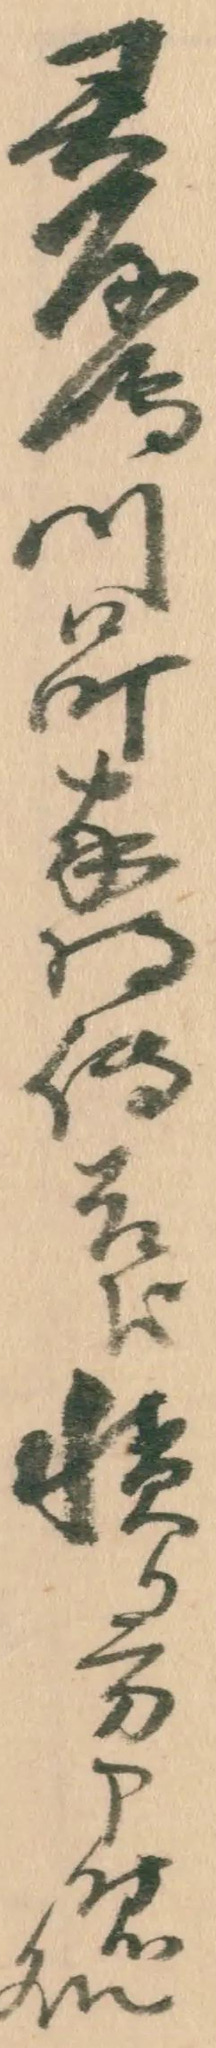霊岸島川口町家持伝吉え積り方申付候処
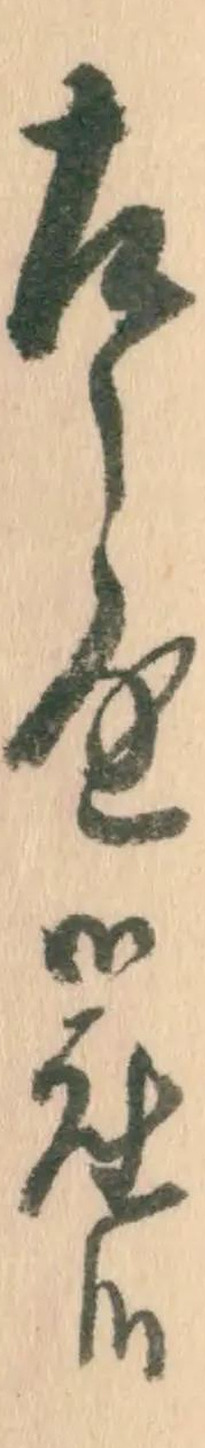左之通御座候
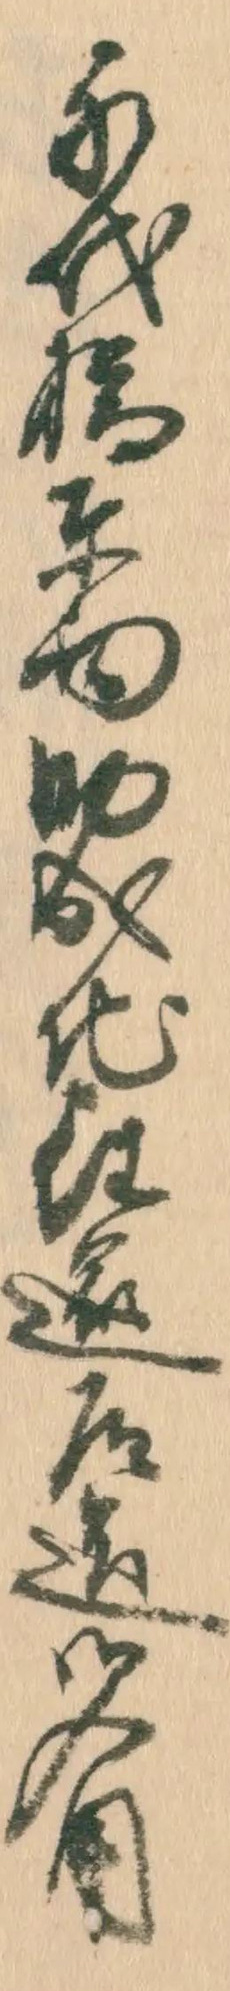永代橋東西助成地往還道造御入用
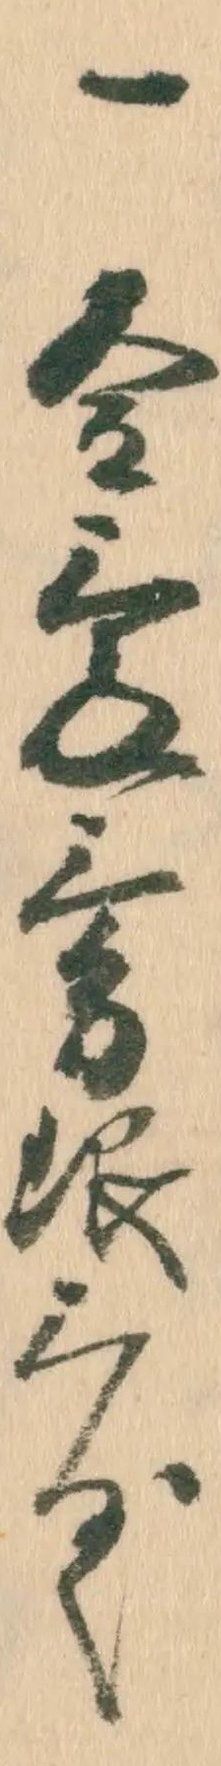一金三両三分銀三匁
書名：三橋 17巻. [8] 三橋小破御修復書留　但御奉行御掛リ替地震潰橋番屋　嘉永四亥年より安政二卯年迄　下
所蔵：国立国会図書館 National Diet Library, JAPAN
